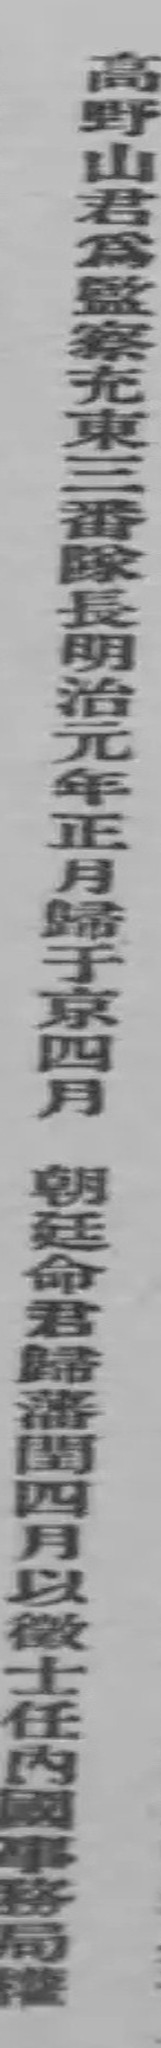高野山君為監察充東三番隊長明治元年正月帰于京四月朝廷命君帰藩閏四月以徴士任内国事務局権
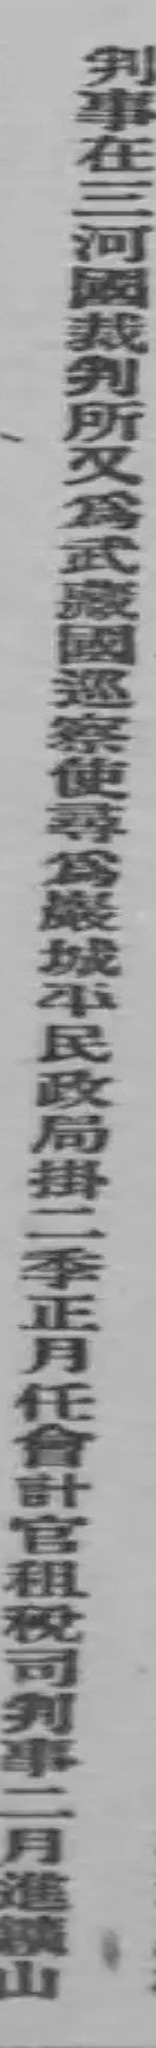判事在三河国裁判所又為武蔵国巡察使尋為厳城平民政局掛二季正月任会計官租税司判事二月進鉱山
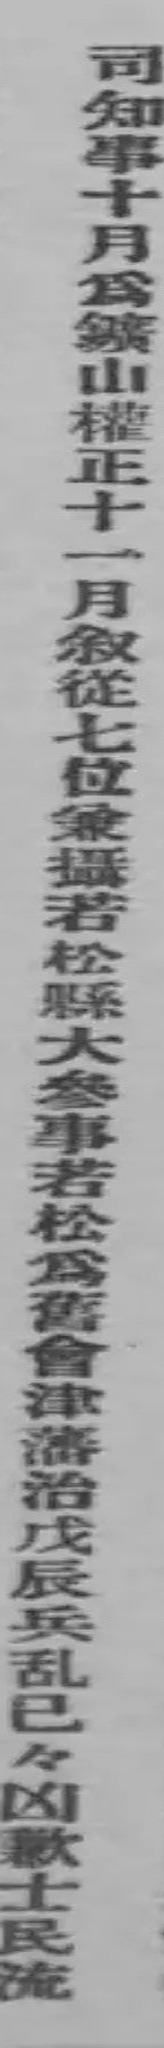司知事十月為鉱山権正十一月叙従七位兼摂若松県大参事若松為旧会津藩治戊辰兵乱巳々凶歉士民流
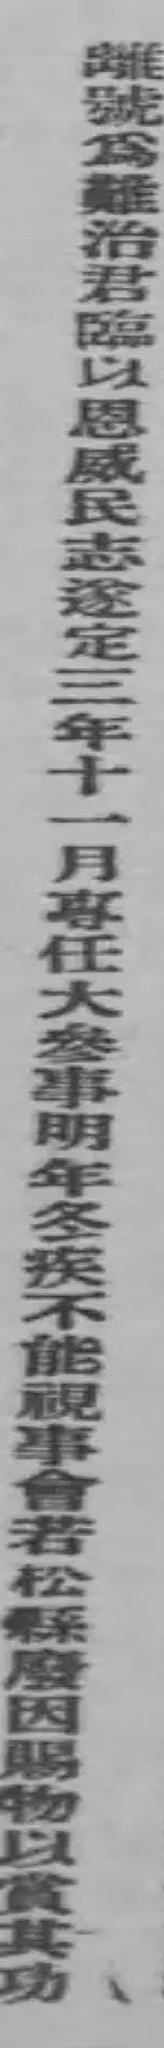離号為難治君臨以恩威民志遂定三年十一月専任大参事明年冬疾不能視事会若松県廃因賜物以賞其功
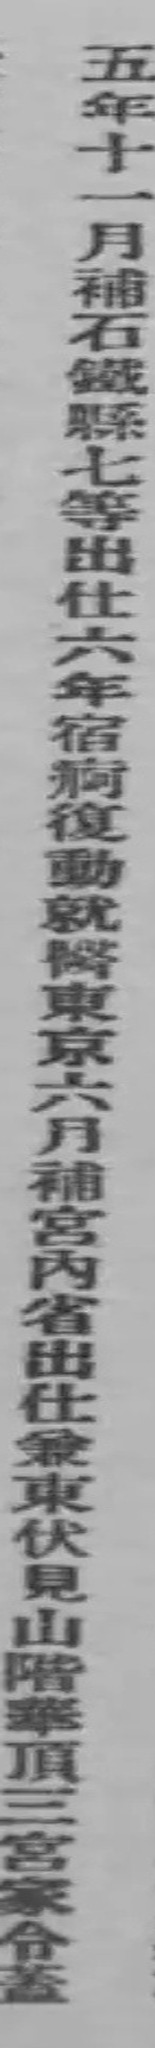五年十一月補石鉄県七等出仕六年宿痾復動就医東京六月補宮内省出仕兼東伏見山階華頂三宮家令蓋
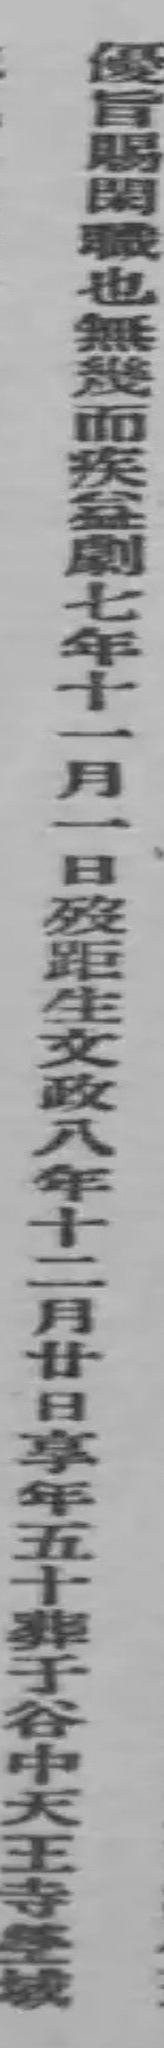優旨賜閑職也無幾而疾益劇七年十一月一日歿距生文政八年十二月廿日享年五十葬于谷中天王寺埜域
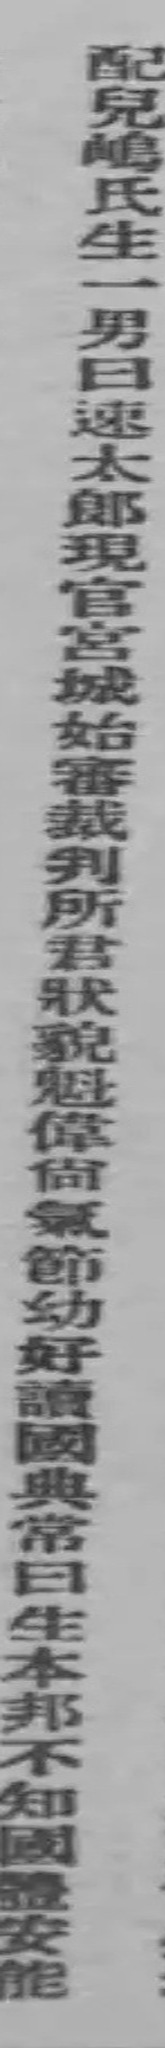配児嶋氏生一男曰速太郎現官宮城始審裁判所君状貌魁偉尚気節幼好読国典常曰生本邦不知国體安能
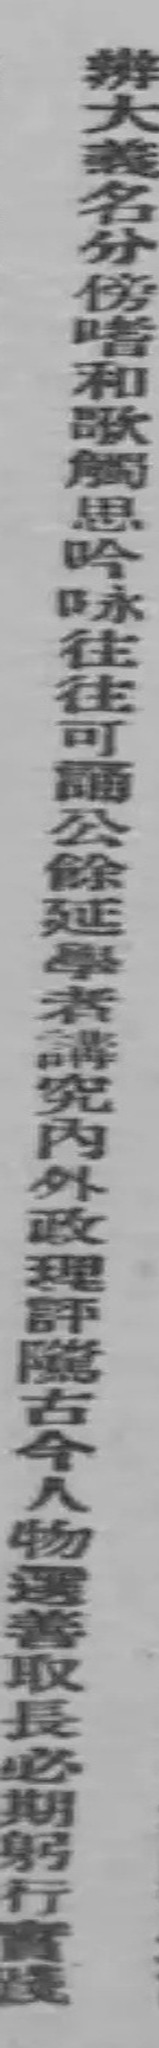弁大義名分傍嗜和歌觸思吟讀往往可踊公余延学者講究内外政理評隲古今人物選善取長必期躬行実践
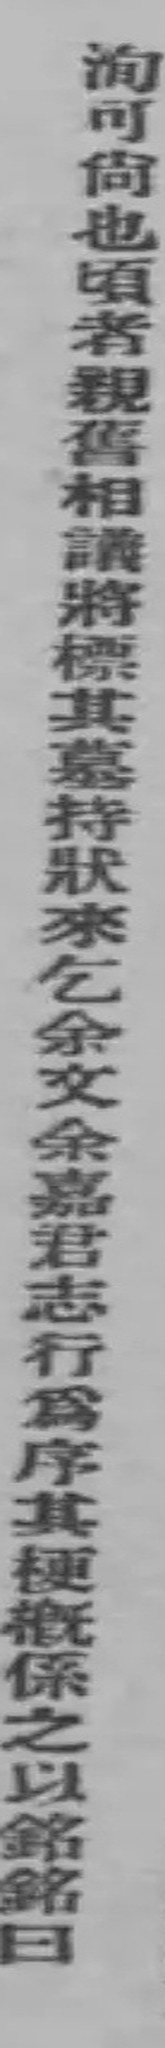洵可尚也頃者親旧相議将標其墓持状来乞余文余嘉君志行為序其梗概係之以銘銘曰
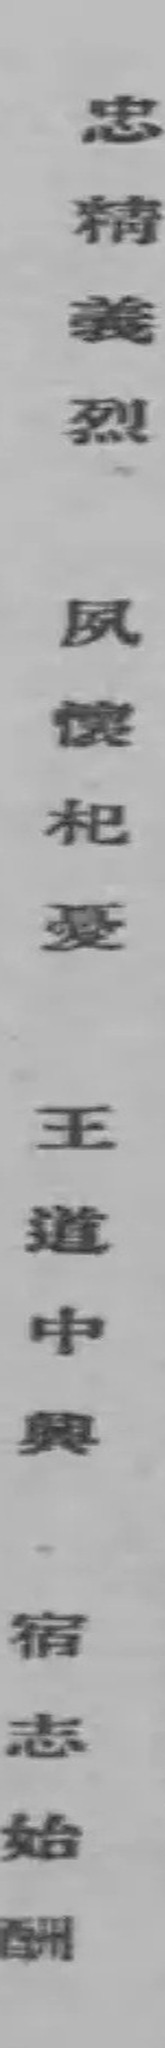忠精義烈夙懐杞憂王道中興宿志始酬
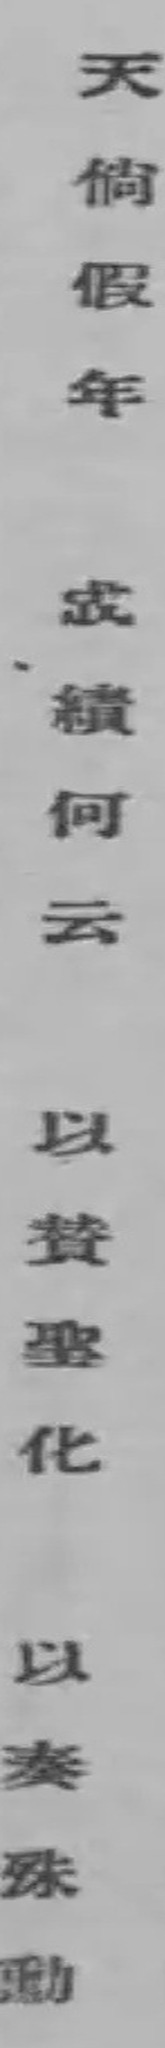天倘仮年成績何云以賛聖化以奏殊勲
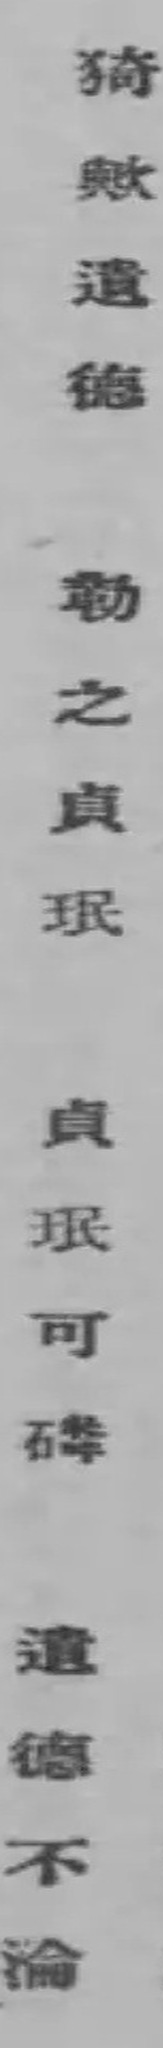猗歟遺徳勒之貞珉定珉可磷遺徳不淪
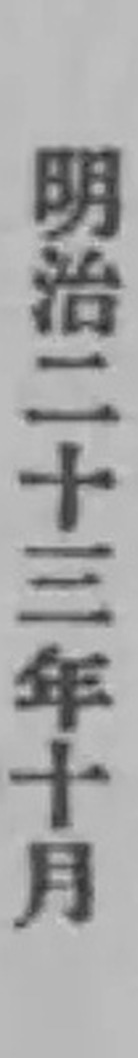明治二十三年十月
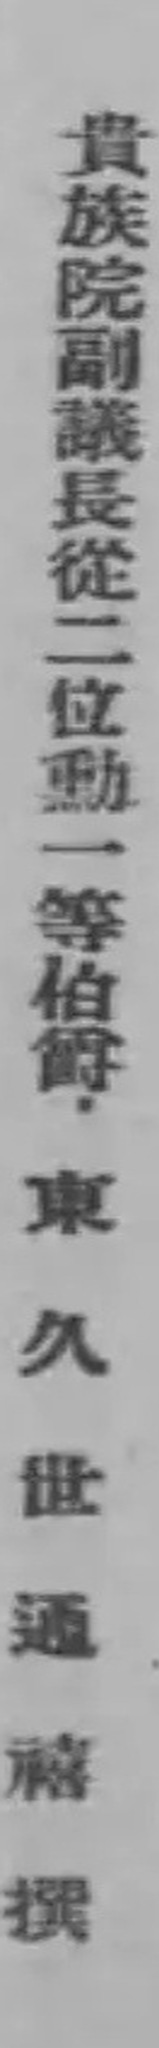貴族院副議長従二位勲一等伯爵東久世道禧撰
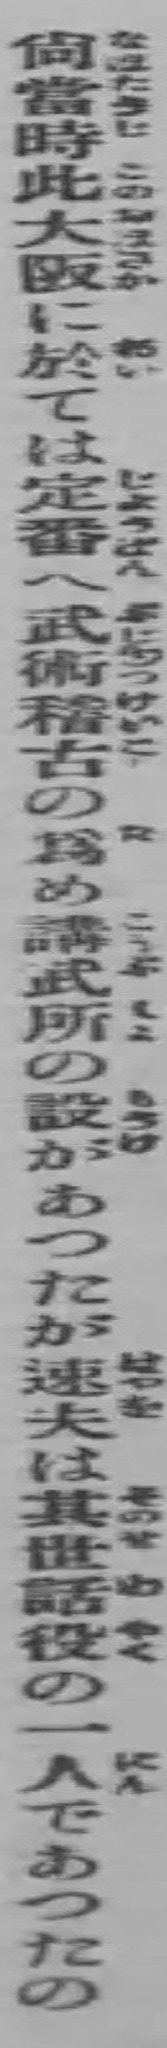尚当時此大阪に於ては定番へ武術稽古の為め講武所の設があつたが速夫は其世話役の一人であつたの
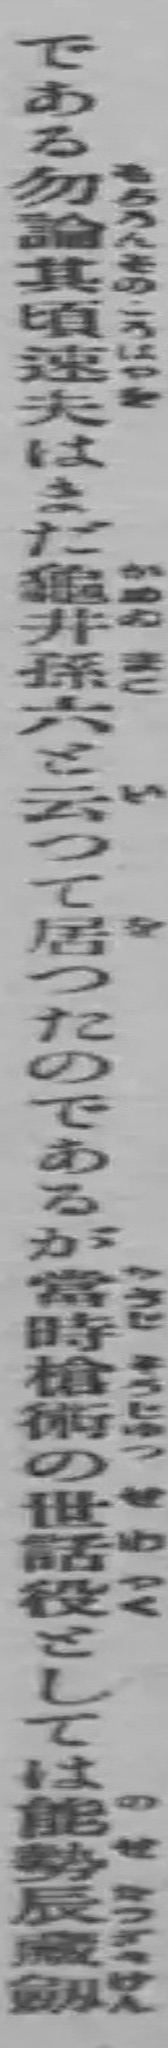能勢辰蔵である勿論其頃速夫はまだ亀井孫六と云つて居つたのであるが当時槍術の世話役としては能勢辰蔵釼
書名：豊橋市史談
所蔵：国立国会図書館 National Diet Library, JAPAN
